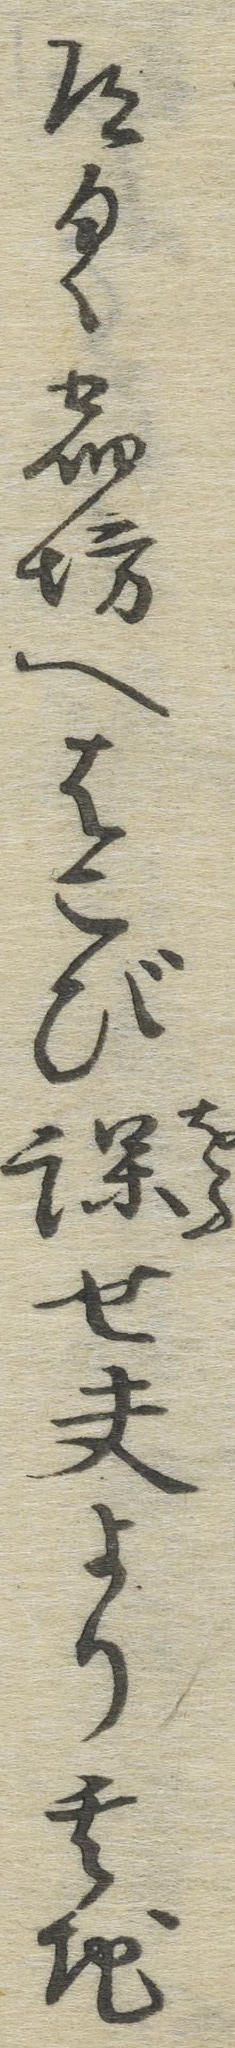道具宿坊へはこび課せ夫より其地
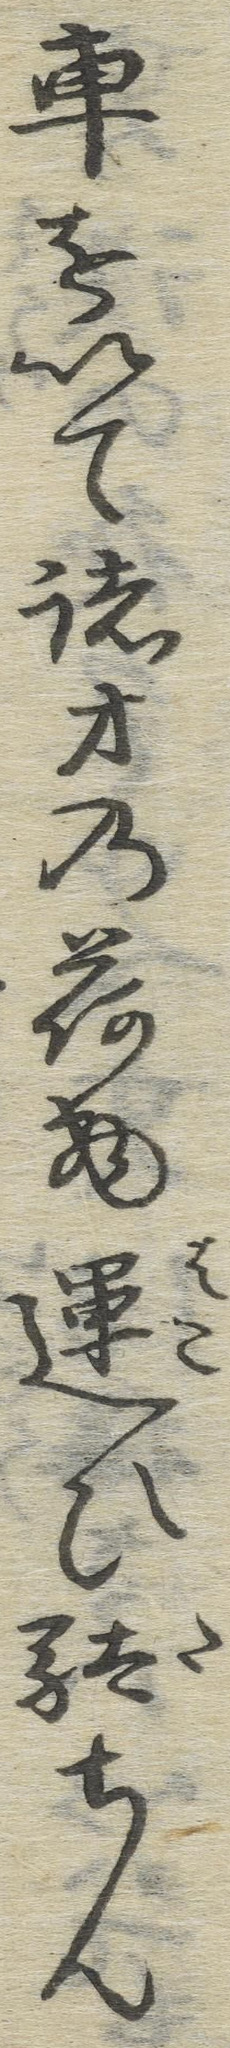車を以て諸方の荷物運ひ駄ちん
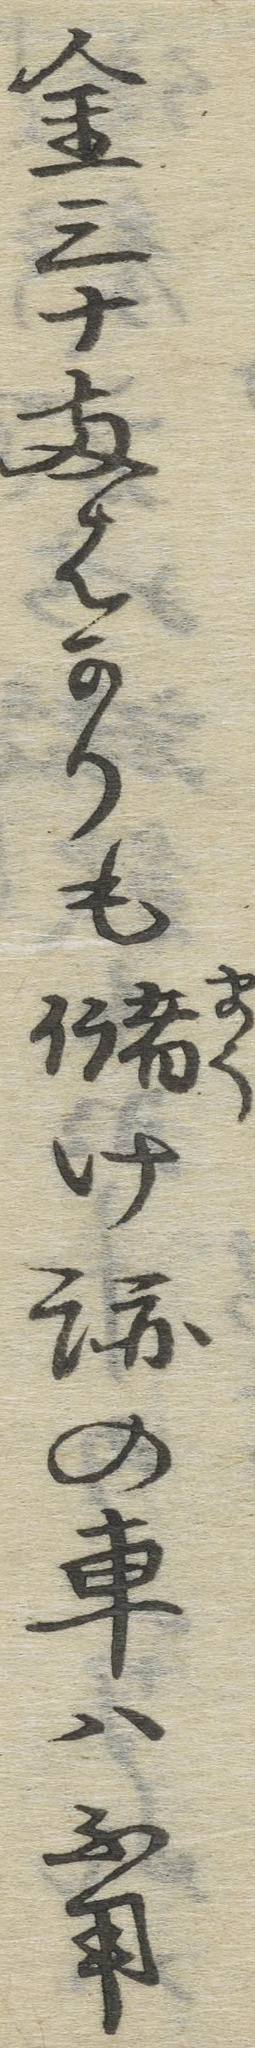金三十両はかりも儲け跡の車は不用
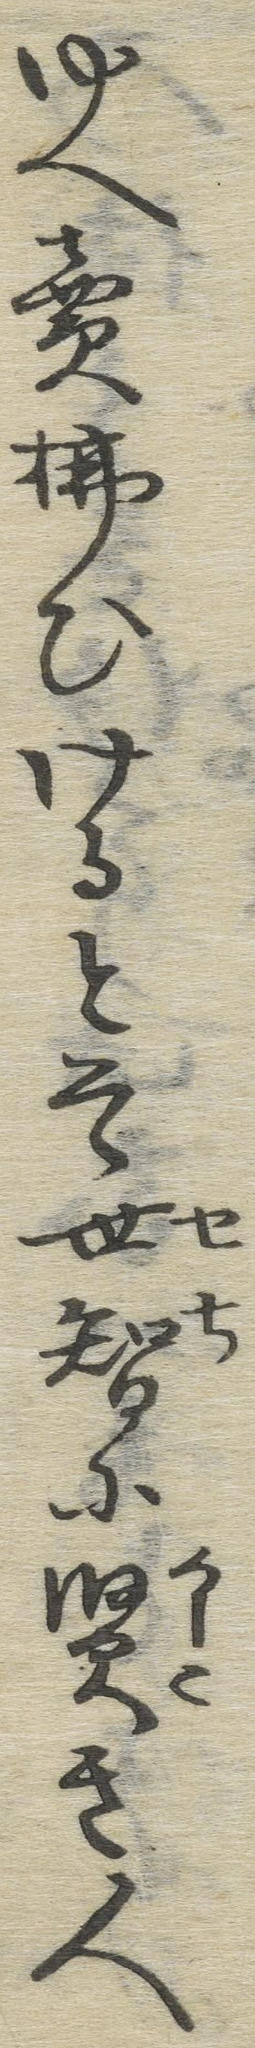ゆへ賣拂ひけるとそ世智に賢き人
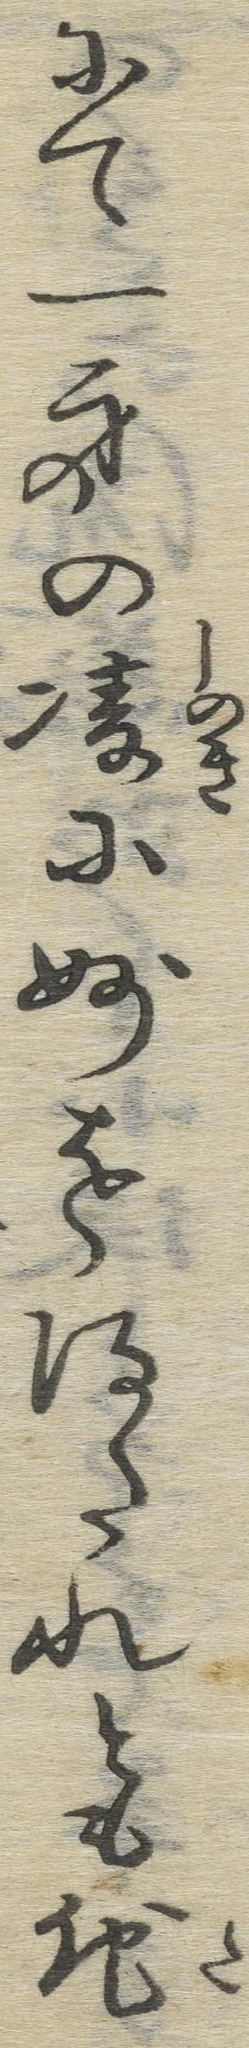にて一身の凌に妙を得たれとも他
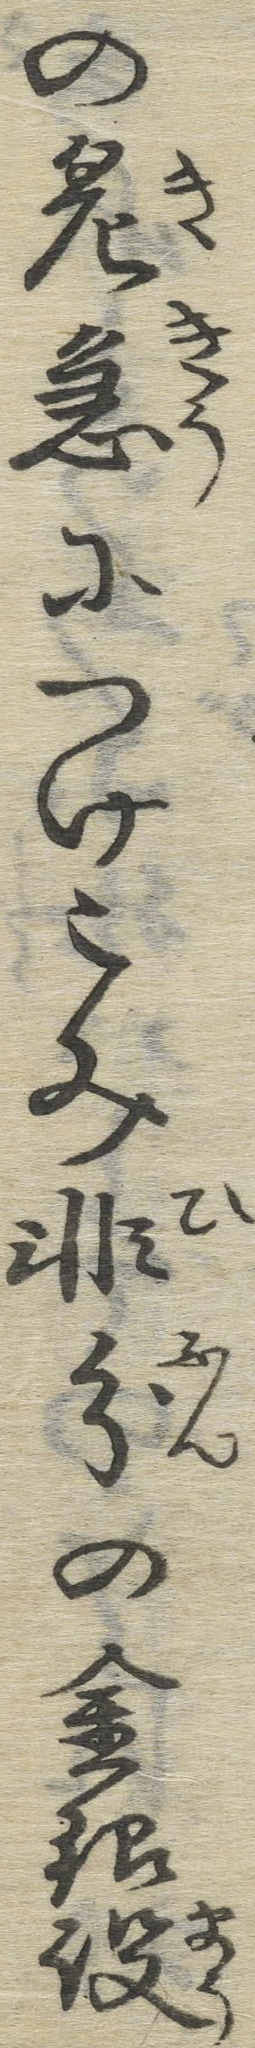の危急につけこみ悲分の金銀設
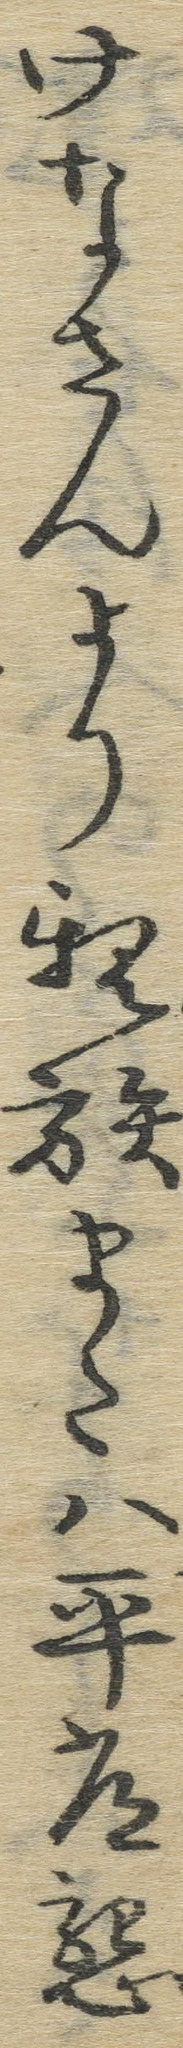けなさんより親族または平常懇
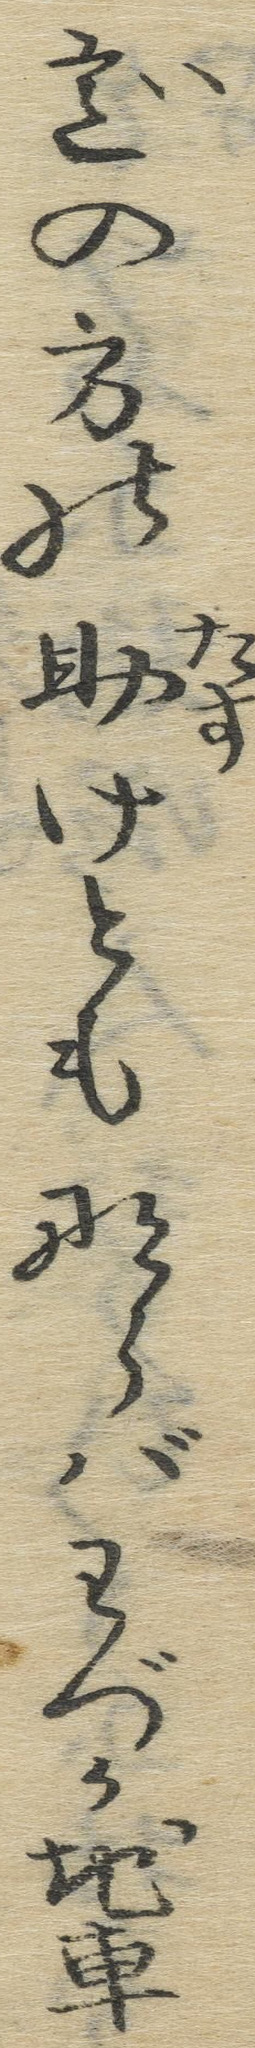意の方の助けともならばわづかに地車
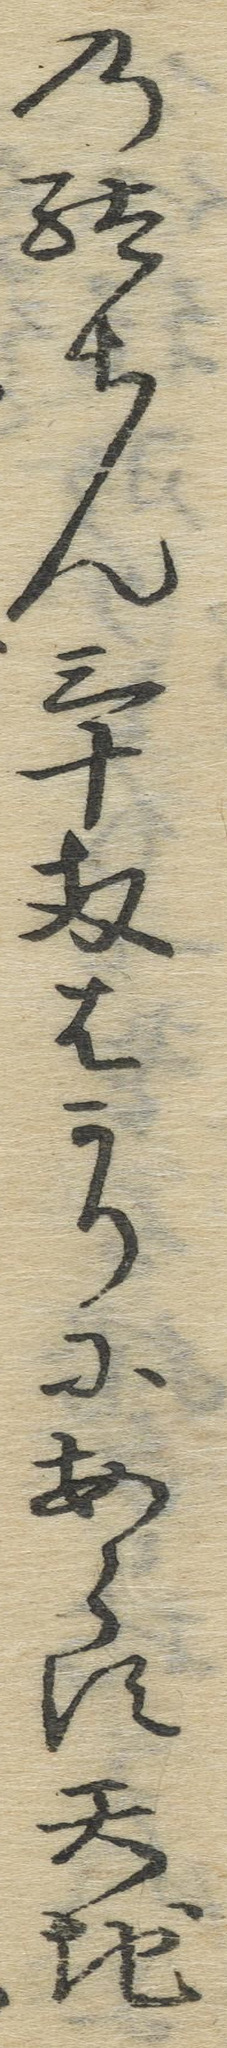の駄ちん三十両ばかりにあらす天地
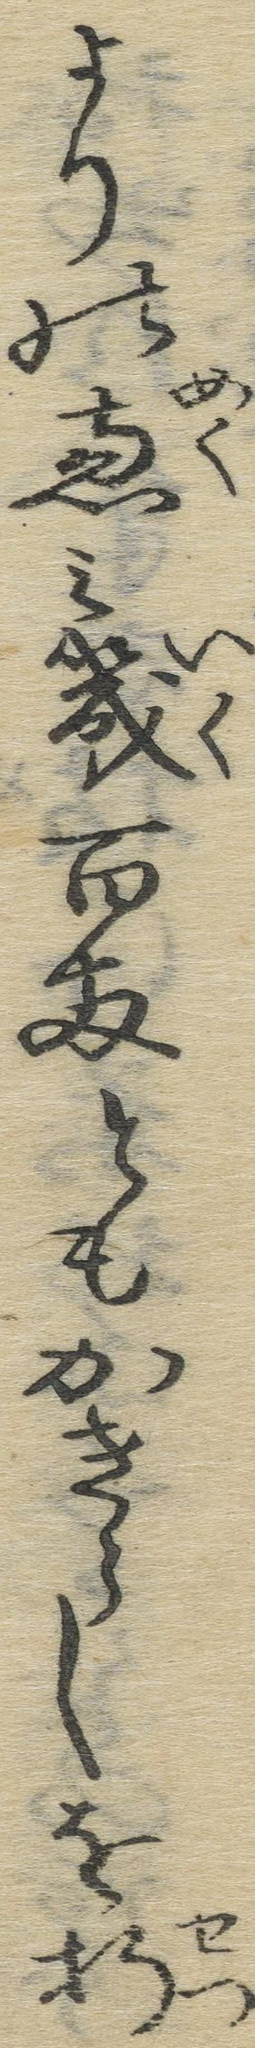よりの恵み幾百両ともかきらしを折
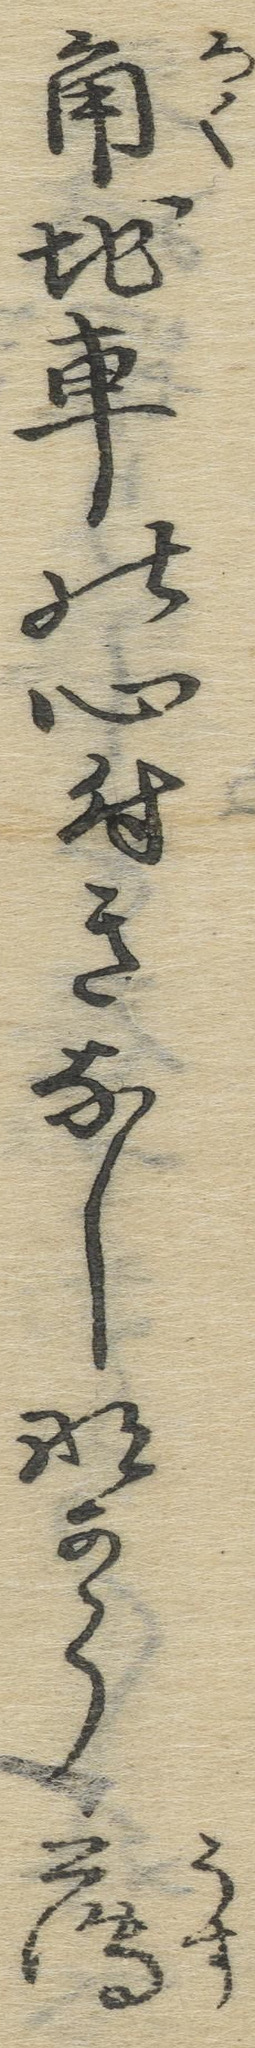角地車の心付きなしなから薄
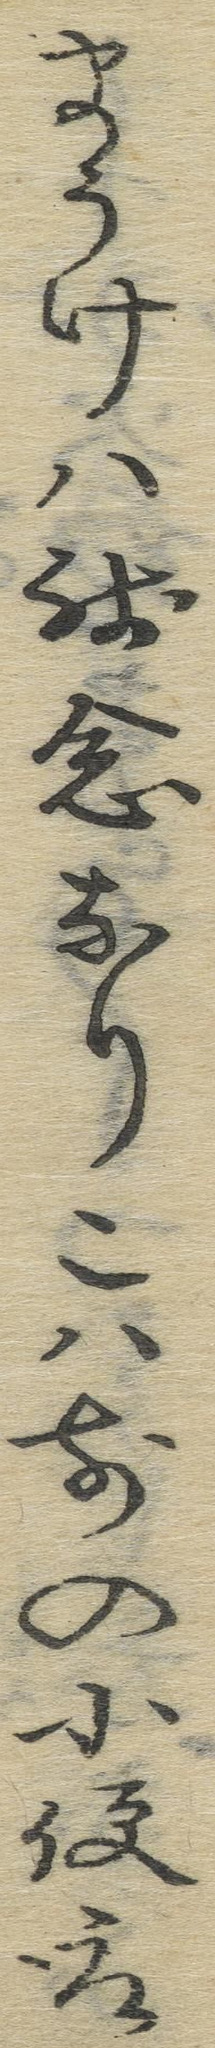まうけは残念なりこは前の小使取
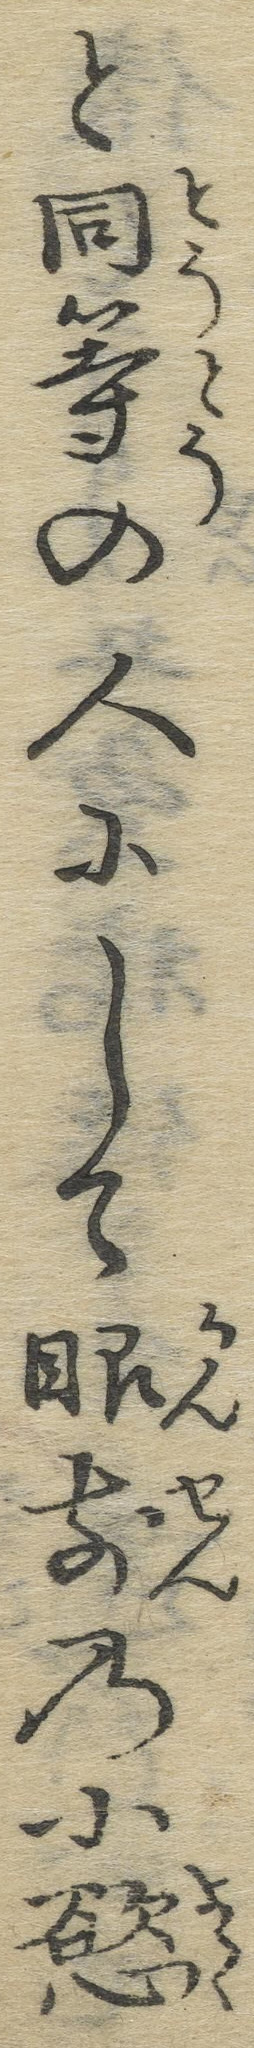と同等の人にして眼前の小慾
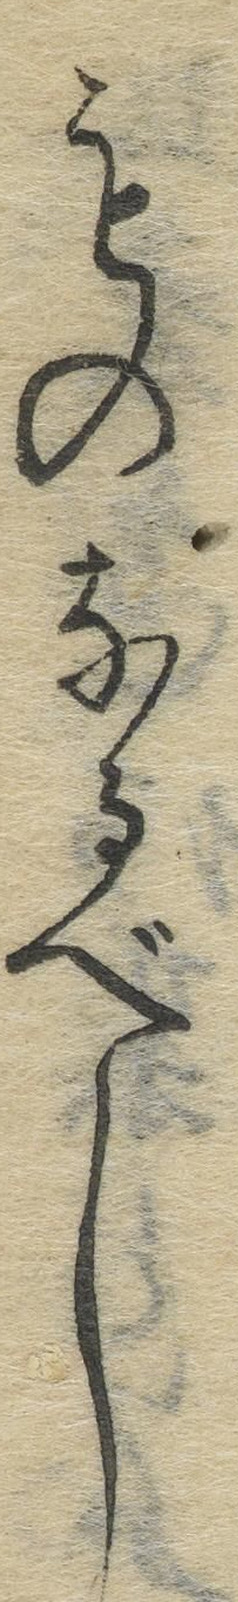ものなるべし

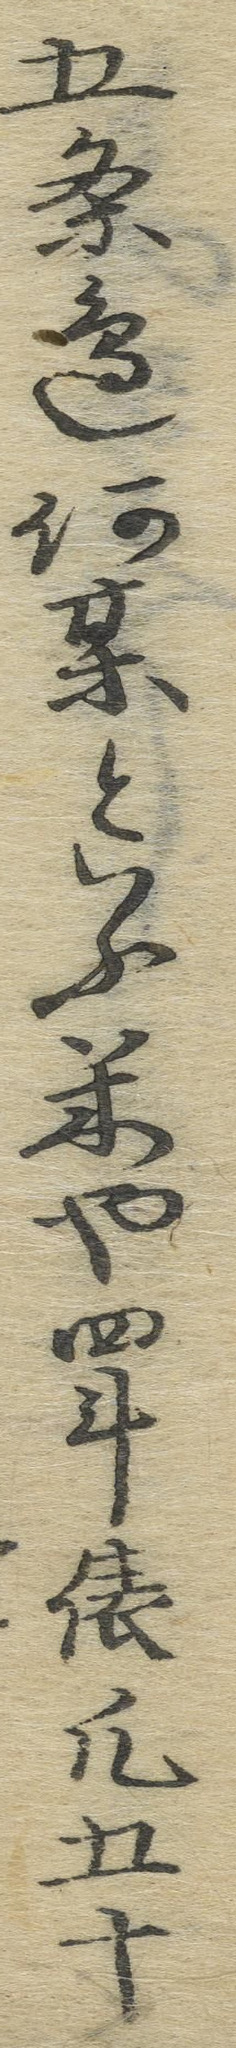五条邊何某といふ米や四斗俵凡五十
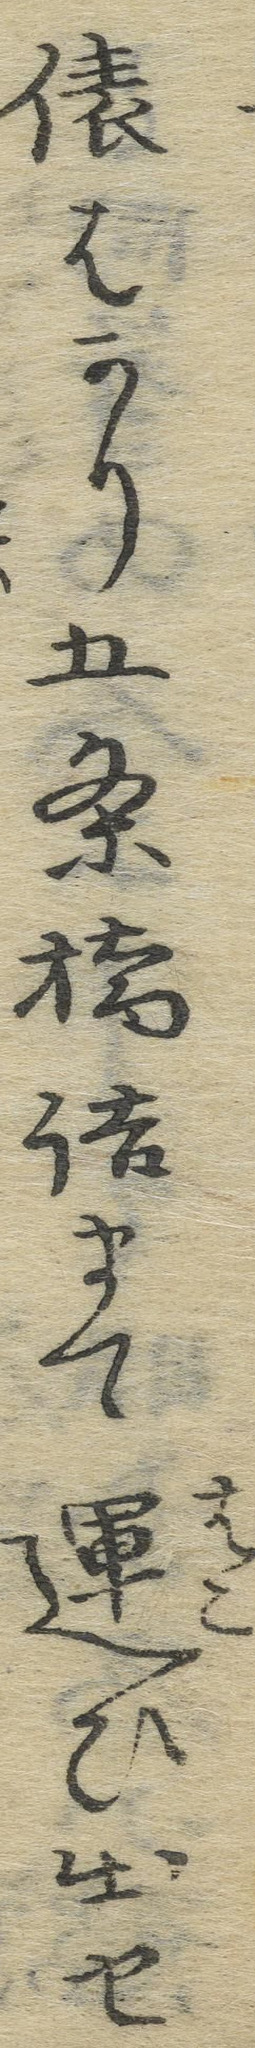俵はかり五条橋詰まて運ひ出せ
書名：あきの日照
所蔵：東京大学地震研究所図書室 Earthquake Research Institute Library, The University of Tokyo, JAPAN
